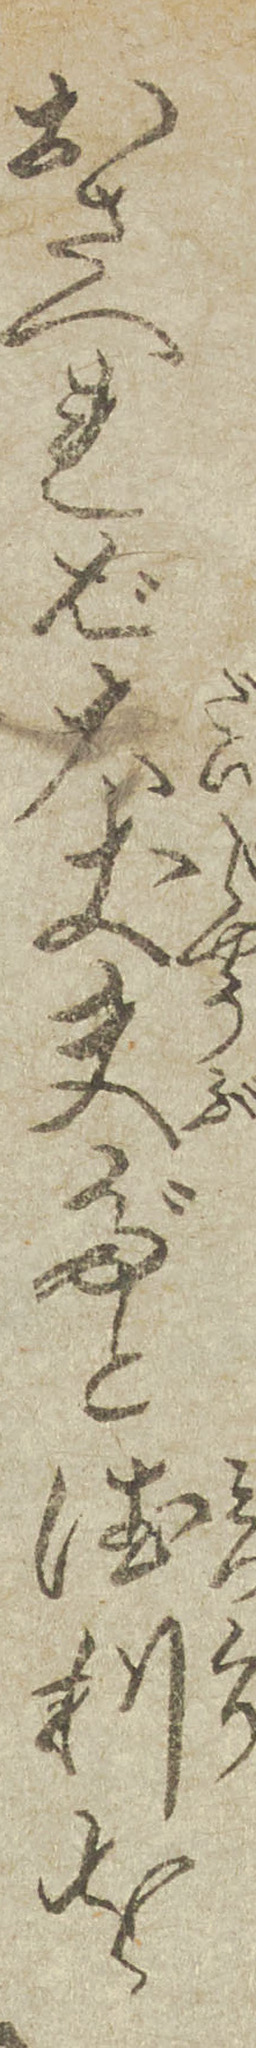おさへれば大丈夫だと徳利を
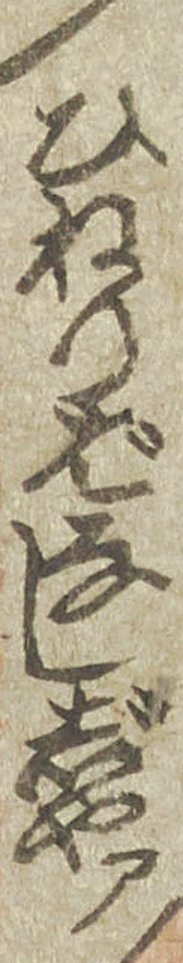ひねりばなしじやア
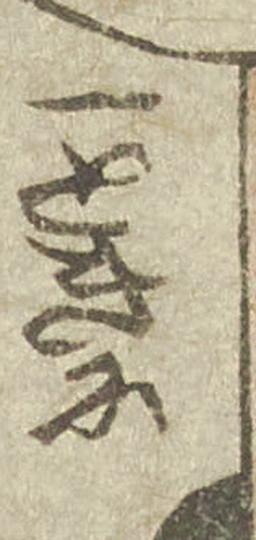一ときに
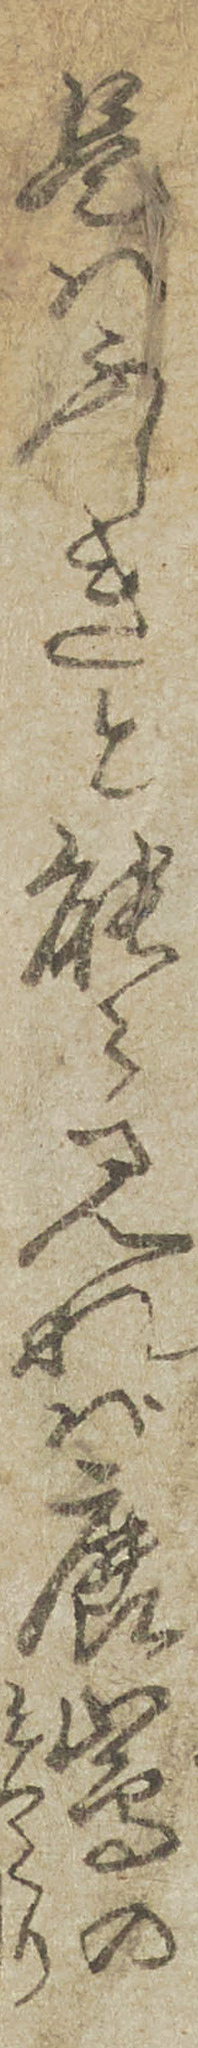是はふしきと能々見れば鹿嶋の
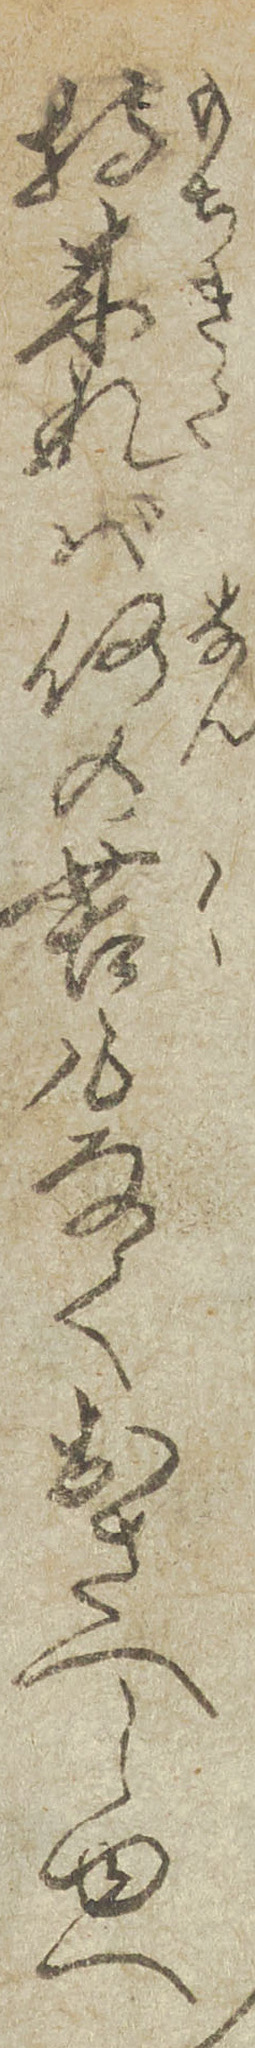持来れば何の苦もなくおさへしゆへ
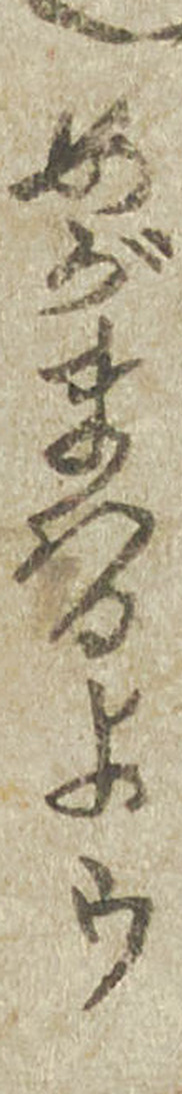めがまはるよウ
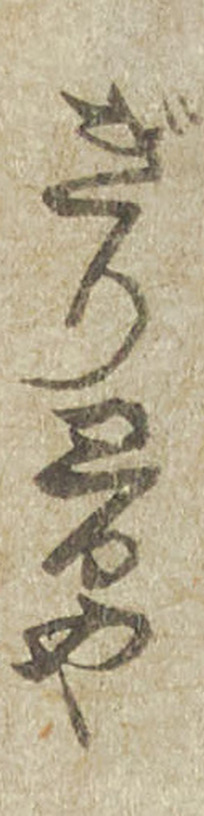ぎりわるや
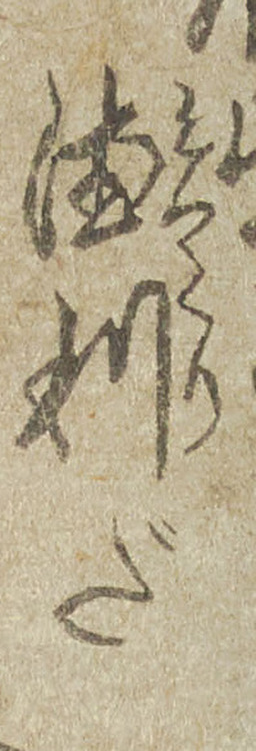徳利だ
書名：治る御代ひやかし鯰
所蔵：東京大学総合図書館 General Library in the University of Tokyo, JAPAN
